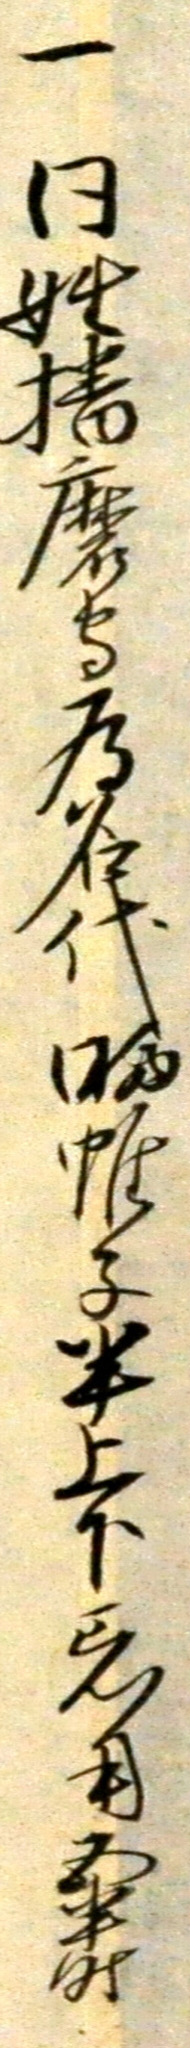一同姓播磨守為名代晒帷子半上下着用五半時
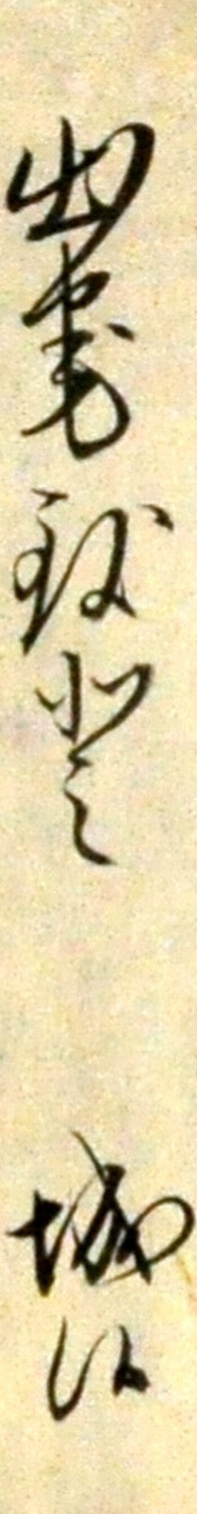出宅致登城候
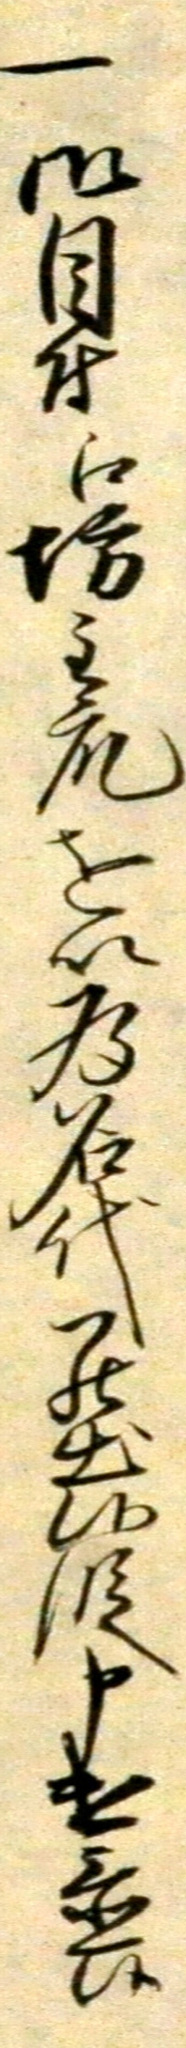一御目付え坊主衆を以為名代罷出候段申遣置候
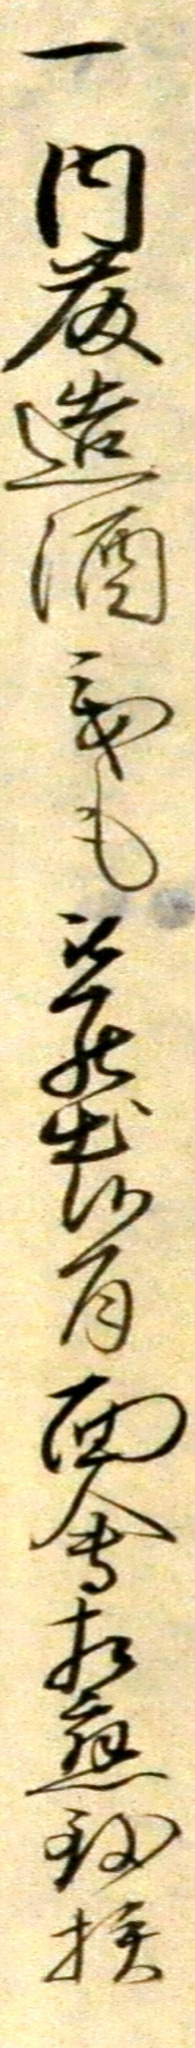一内藤造酒義も被罷出候間面会相応致挨
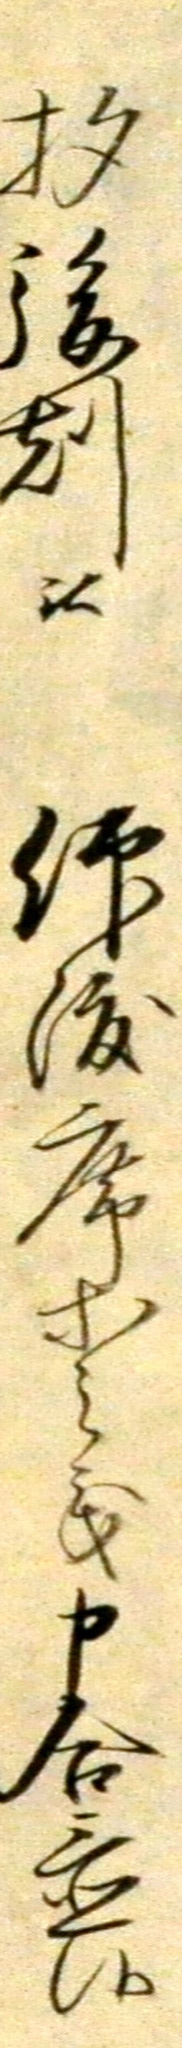拶後刻被仰渡席等之義申合置候
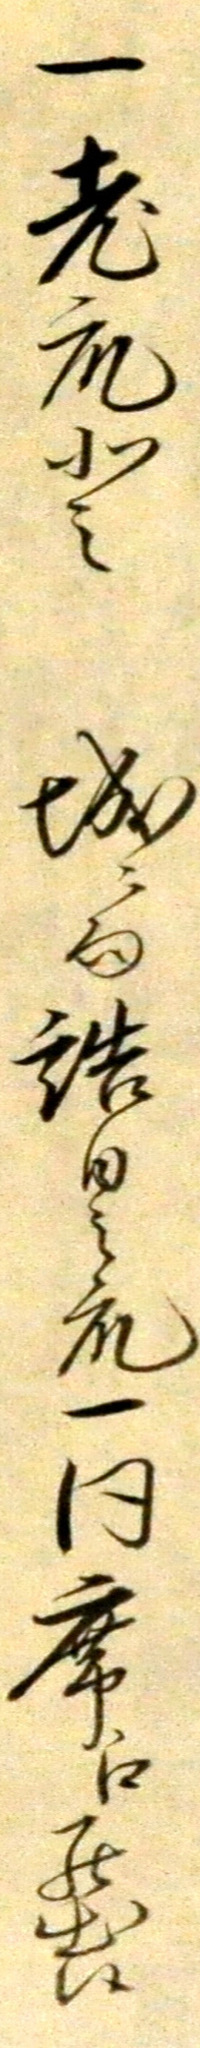一老衆登城ニ而詰日之衆一同席え罷出候
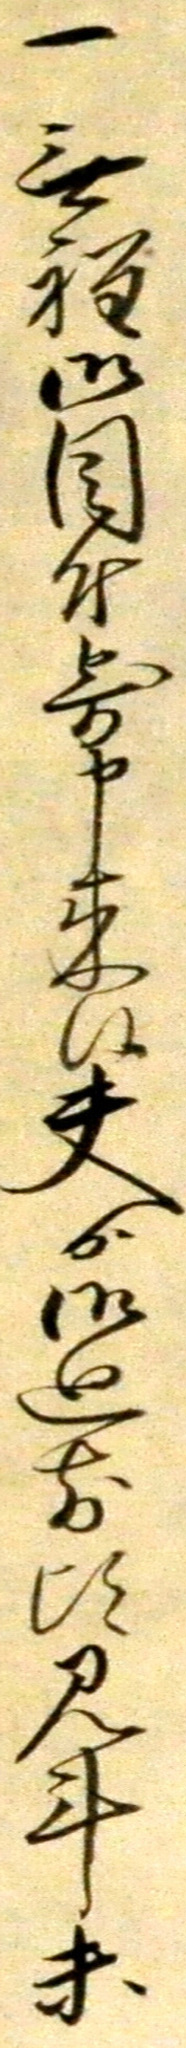一無程御目付寄申来候夫ゟ御廻前頃見計末
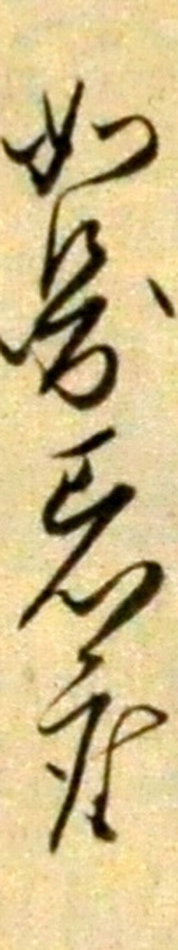如図着座
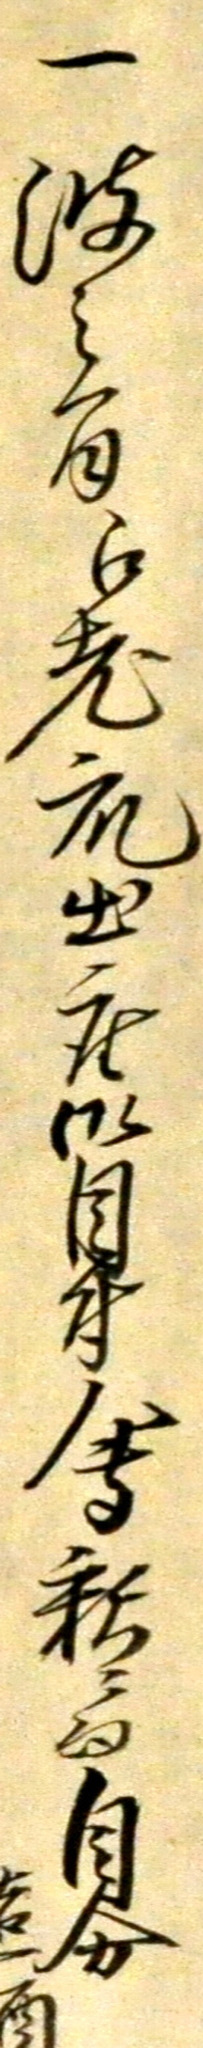一波之間え老衆出座御目付会釈ニ而自分造酒
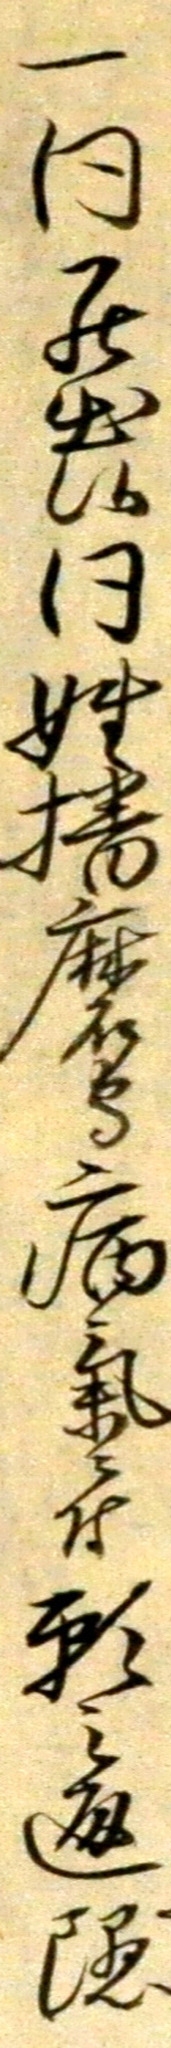一同罷出候同姓播磨守病気ニ付願之通隠
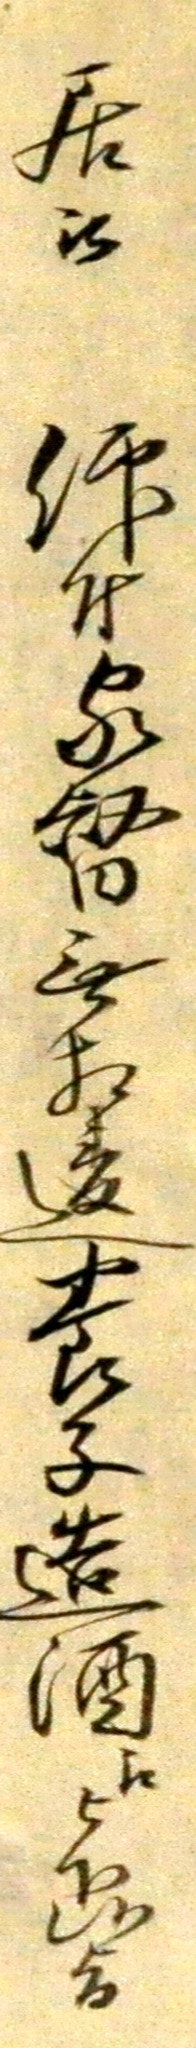居被仰付家督無相違養子造酒え被下候旨
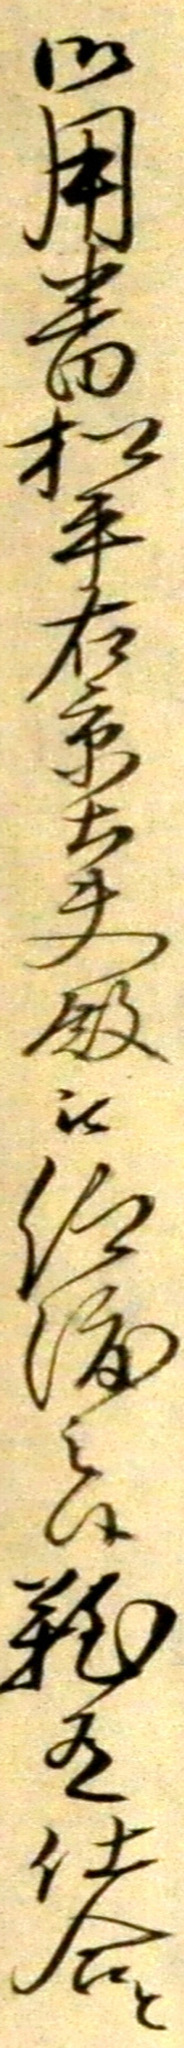御用番松平右京大夫殿被仰渡之候難有仕合と
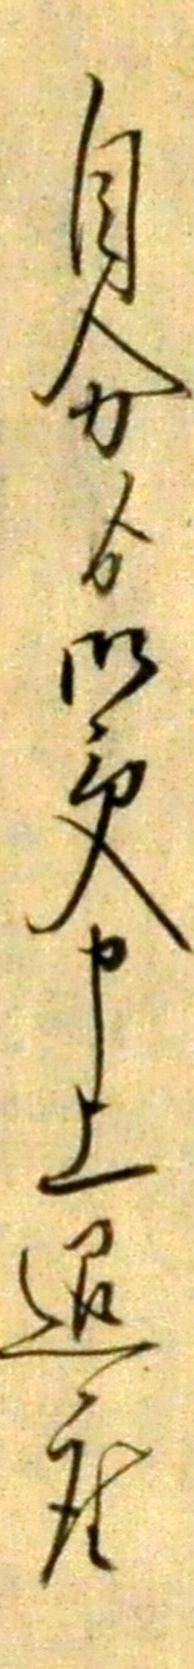自分ゟ御受申上退座
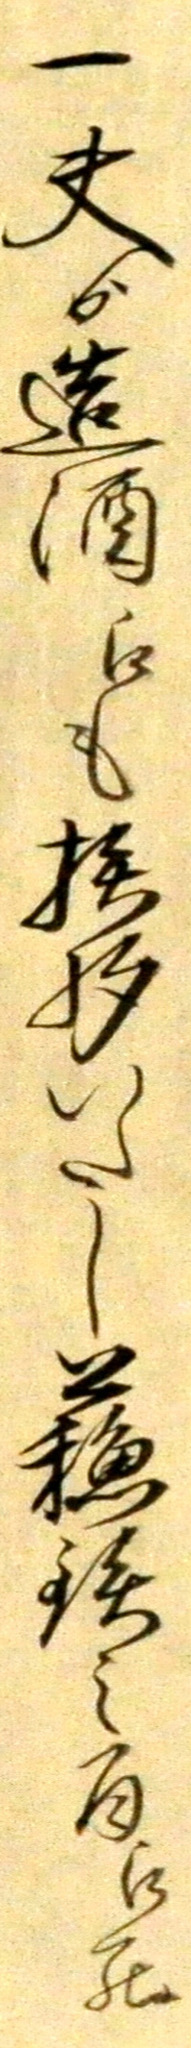一夫ゟ造酒えも挨拶いたし蘇鉄之間え罷
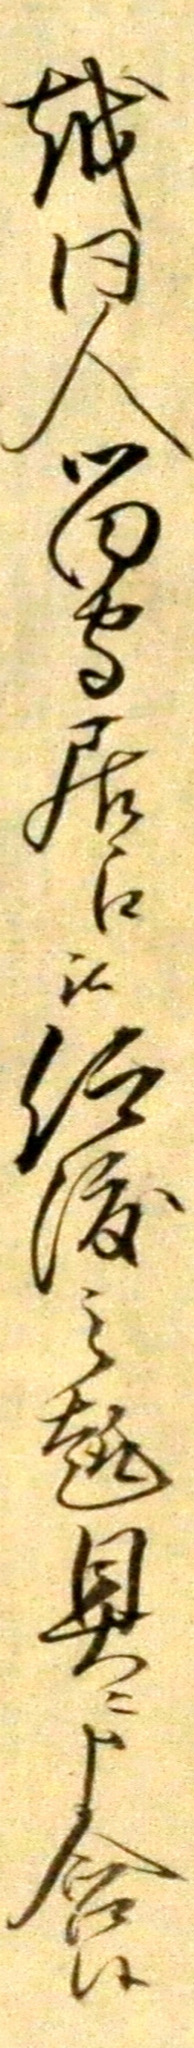越同人留守居え被仰渡之趣具ニ申含候
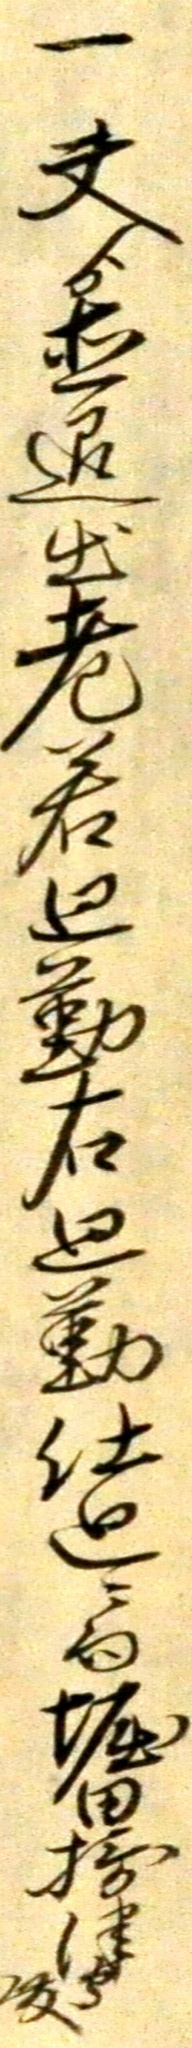一夫ゟ直退出老若廻勤右廻勤仕廻ニ而堀田攝津守殿
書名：諸名代相勤候節ノ留書外
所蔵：伊那市立高遠町図書館・合同会社AMANE
